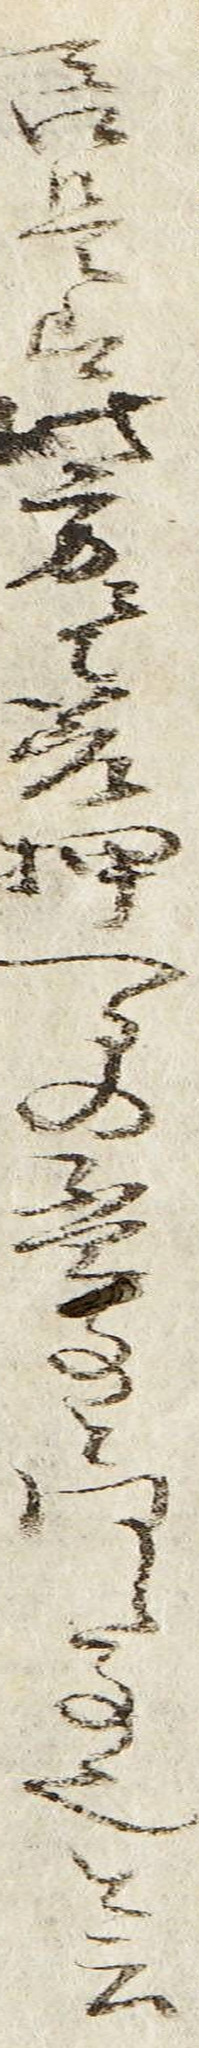呑是は此方にて差押へるの盃事と同し事也と云
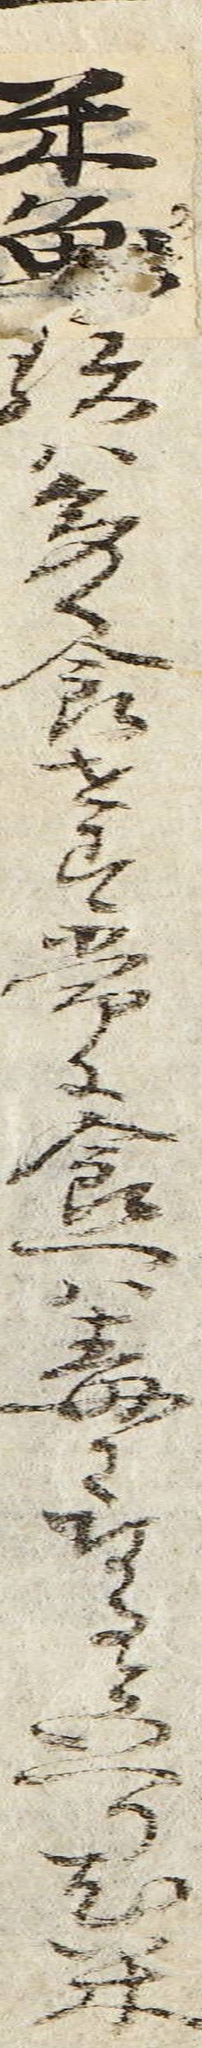一米魚類は多く食せす常に食へは毒になるといへり尤米
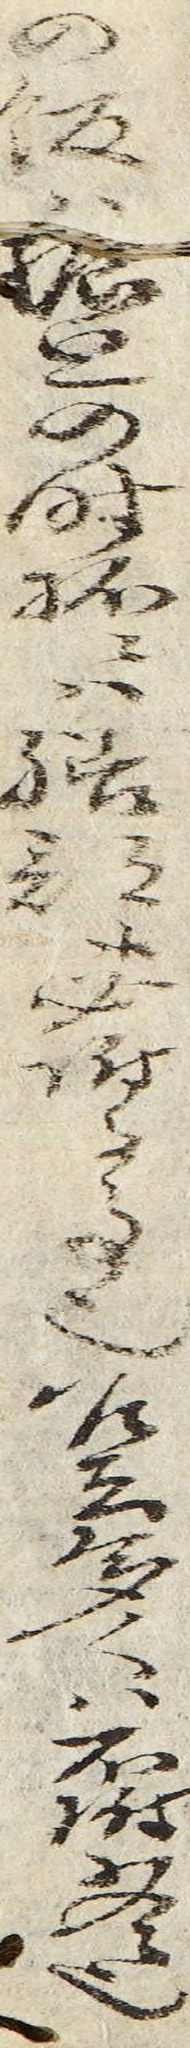の飯は振廻の時抔には膳部江必附る事也乍去多くは不附少々也

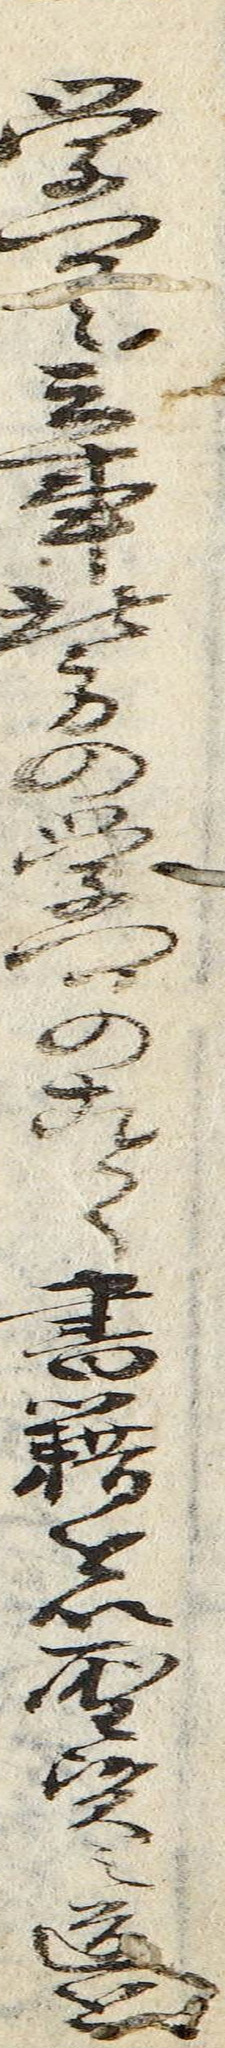一学問と云事此方の学問のことく書籍を以聖賢之道を
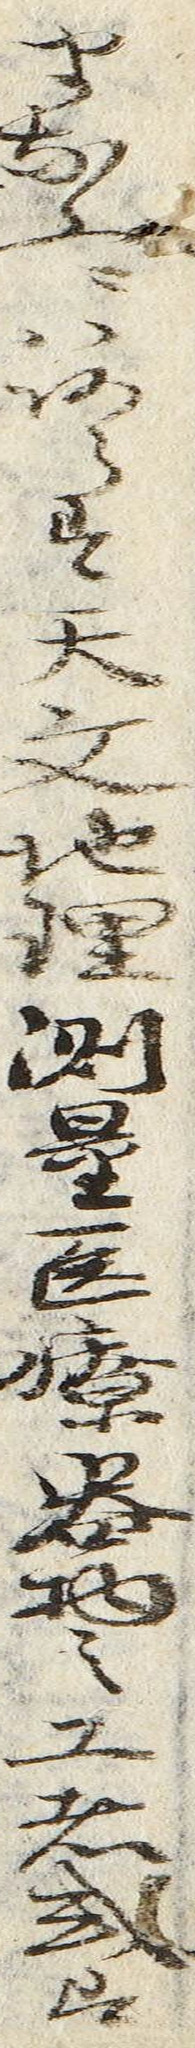まなふにはあらす天文地理測量医療器物之工者或は
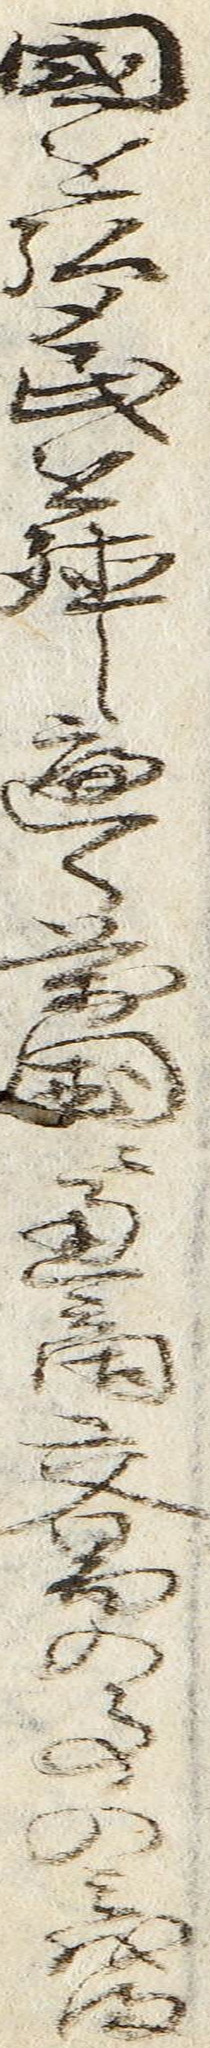国を弘め民を殖し遍く万国に通商交易の事のみをま
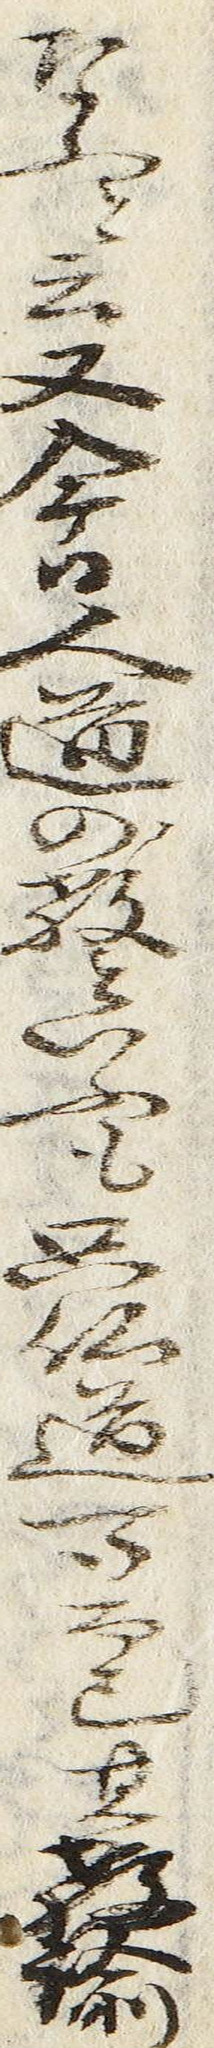なふと云又今日人道の教をいふも只仏道一つ而己其教諭
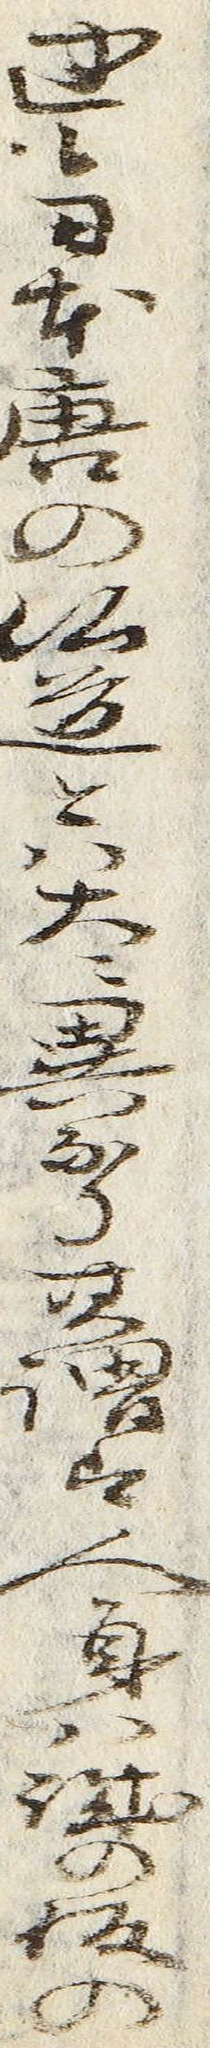迚も日本唐の仏道とは大に異なり其謂は人身は誠の仮の
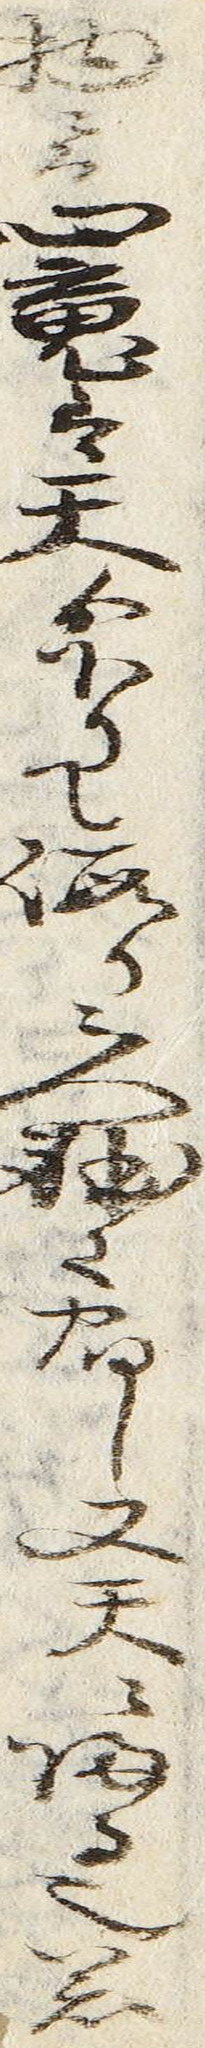物に而心魂は天ゟ下りて仮りに人体に宿し又天に帰る也若
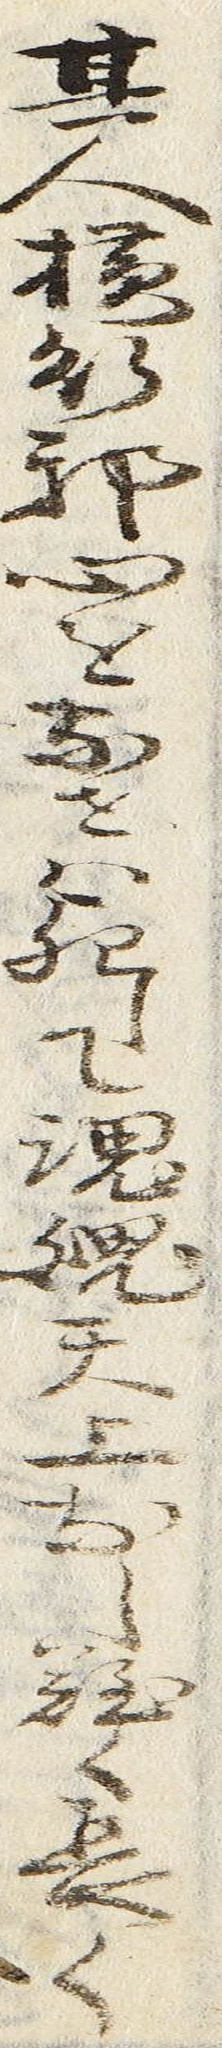其人横行邪心をなせは死して魂魄天上なし難く長く
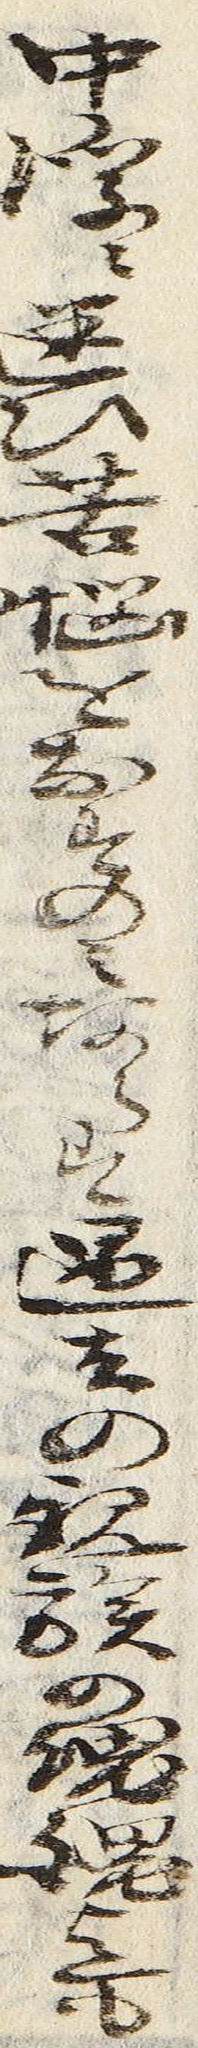中浮に迷ひ苦悩をなすのみならす過去の親族の魂魄迄も
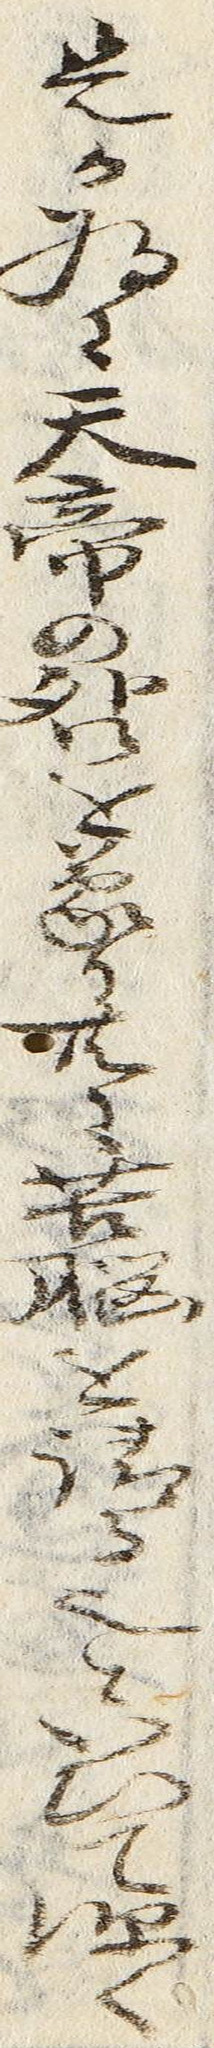是か為に天帝の咎を蒙り共に苦脳を請る也といひて深く
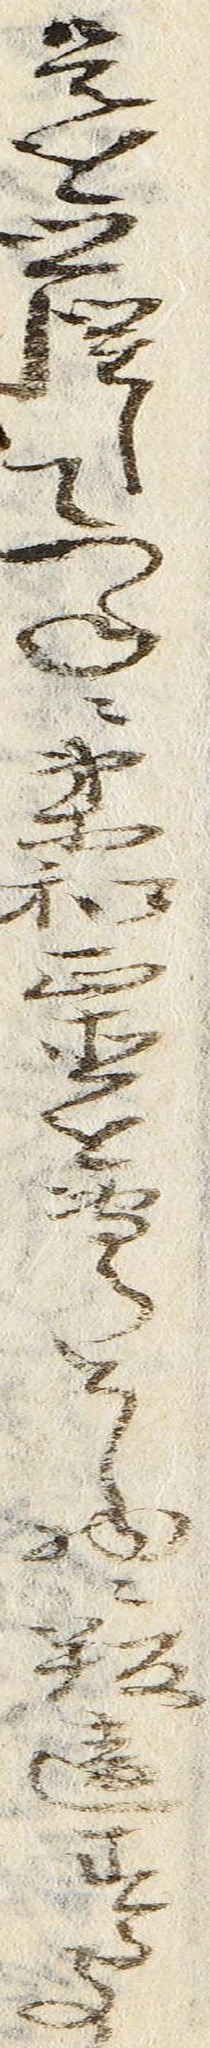是を恐懼してつねに柔和正直を専らとしに叛違する事
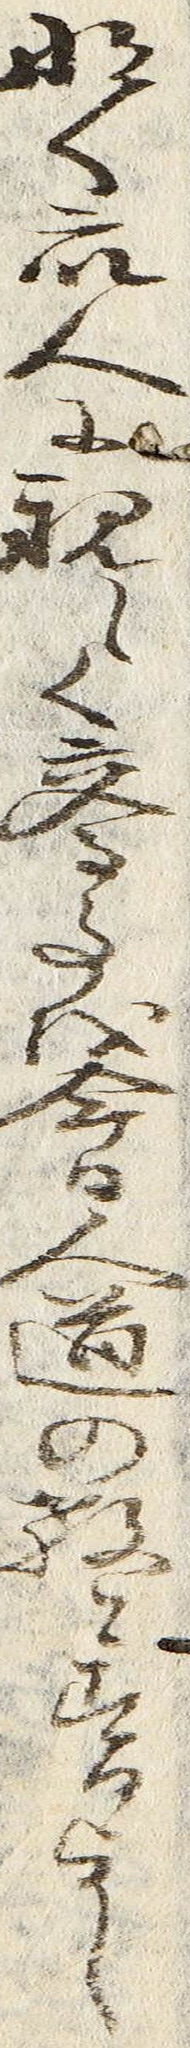なく衆人に親しく交る事を今日人道の教とするよし
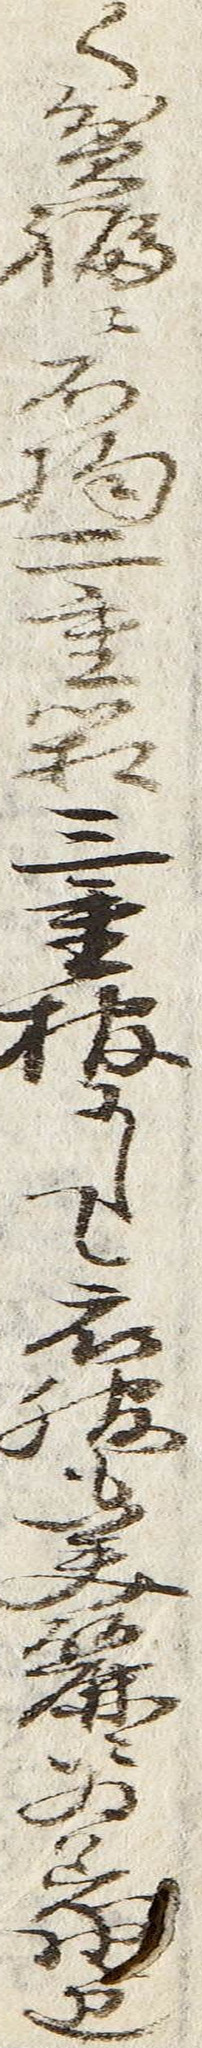く貧福に不拘二重箱三重棺にして衣服も美麗に為着野辺
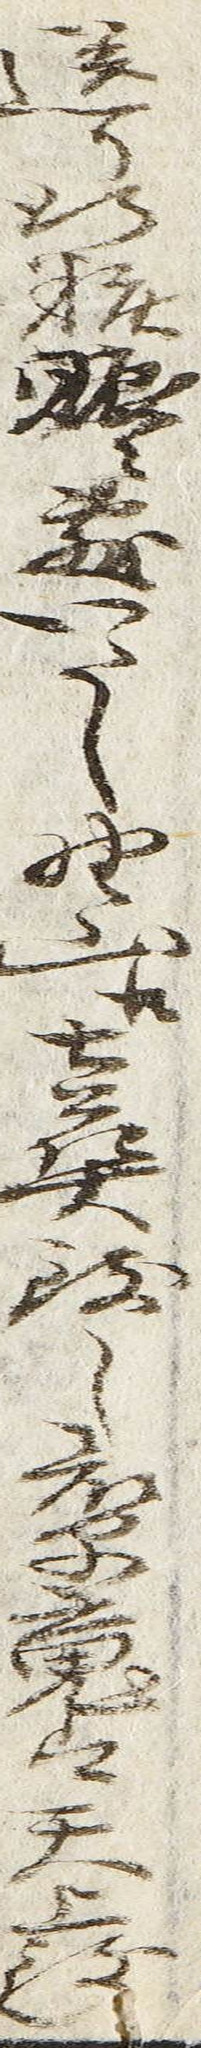送り行粧賑々敷いたし野山江土葬致し最早魂は天上致
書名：漂流夢物語
